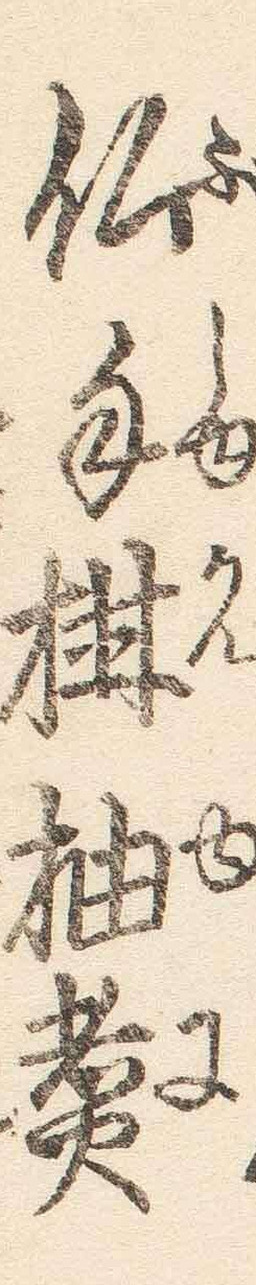仏手柑柚煮
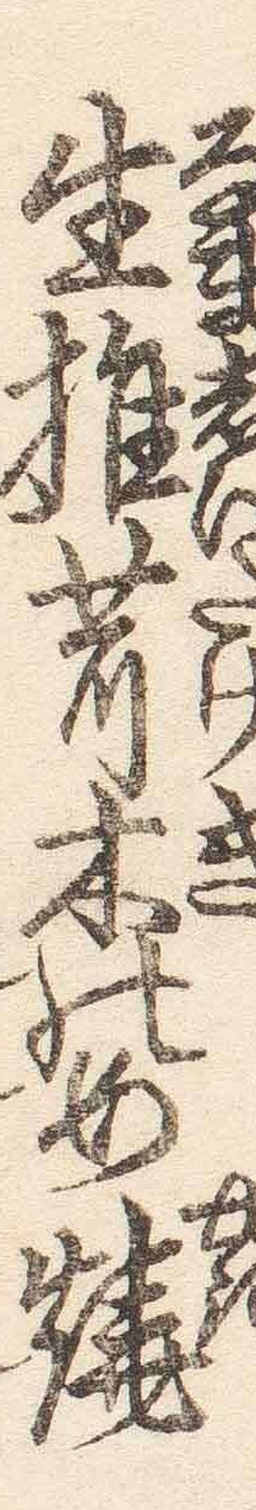生椎茸木のめ焼
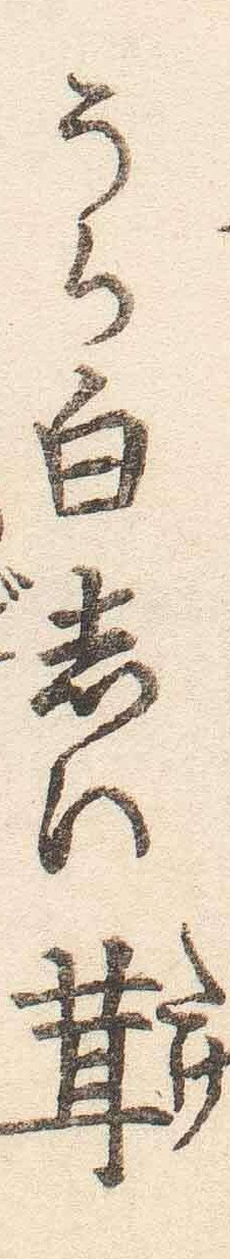うら白しい茸
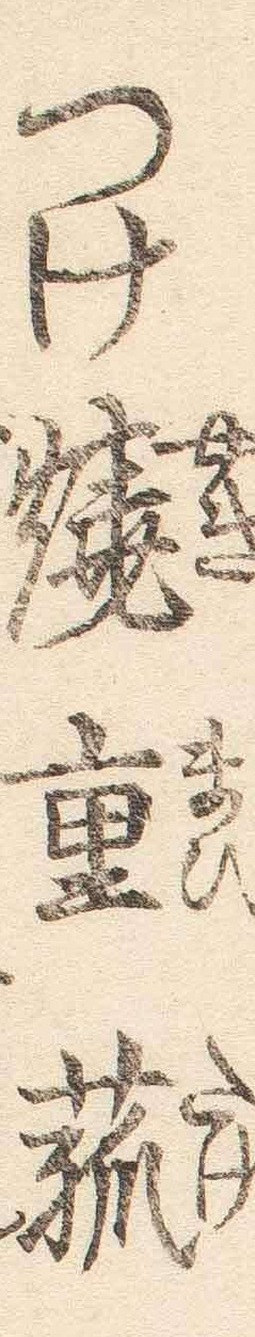つけ焼重菰
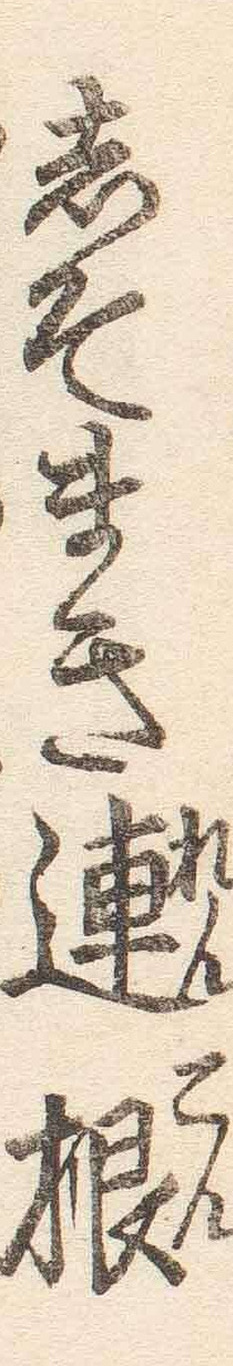しそまき連根
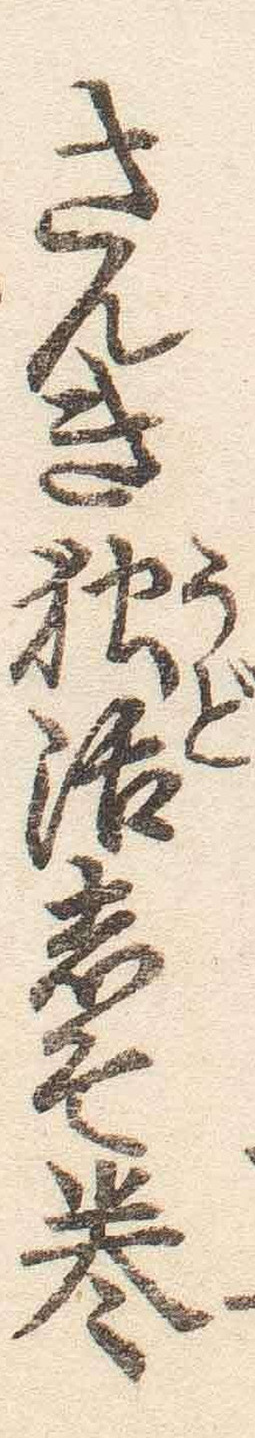さんき独活しそ巻
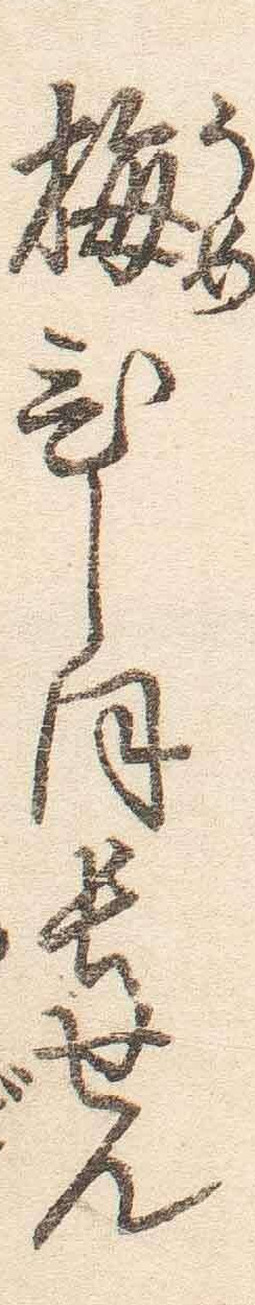梅ひしほ長せん
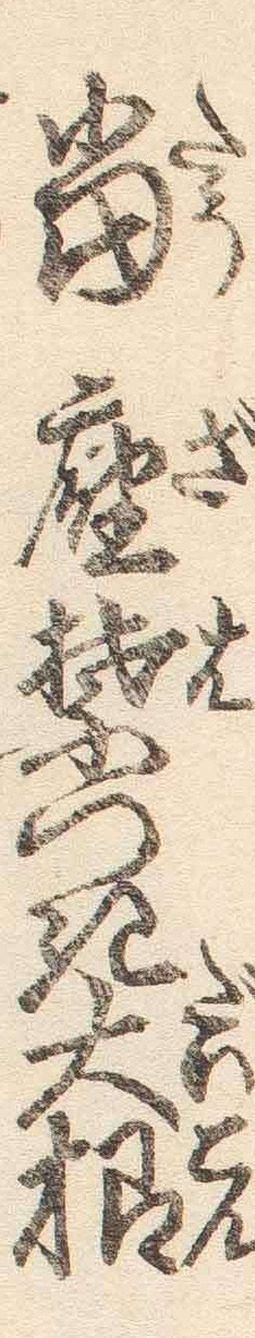当座葉つき大根
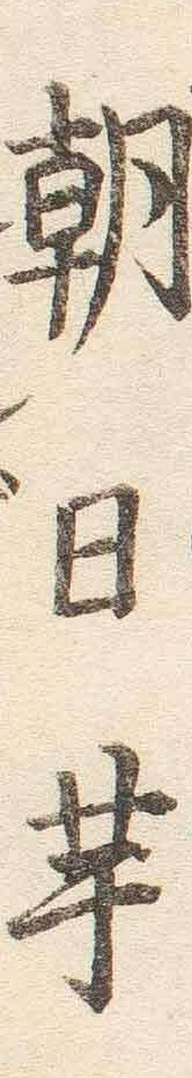朝日芋
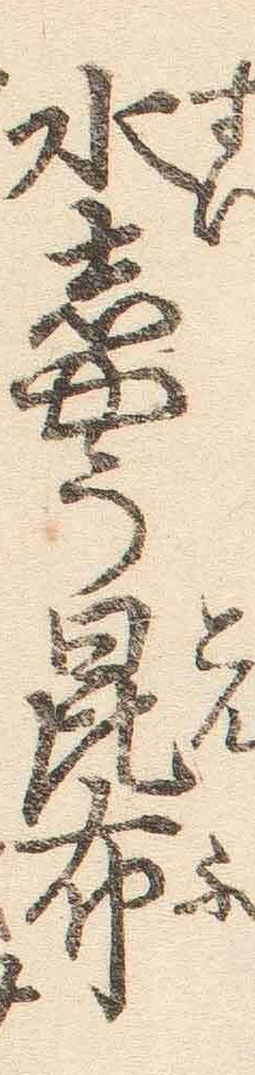水しやう昆布
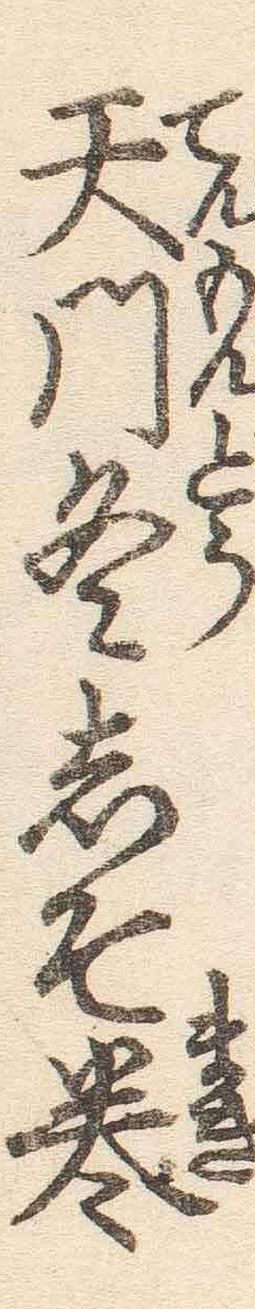天門冬しそ巻
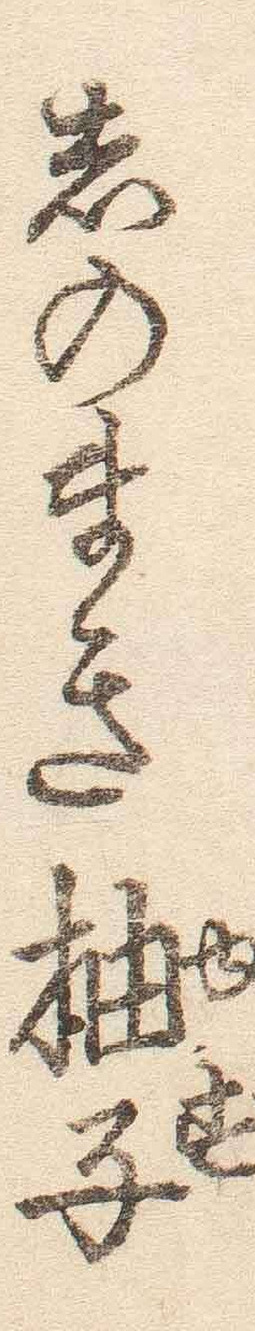しのまき柚子
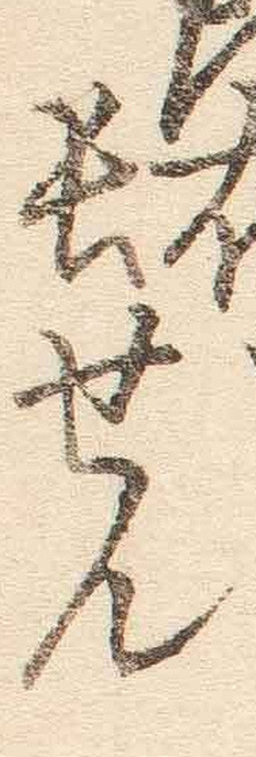長せん
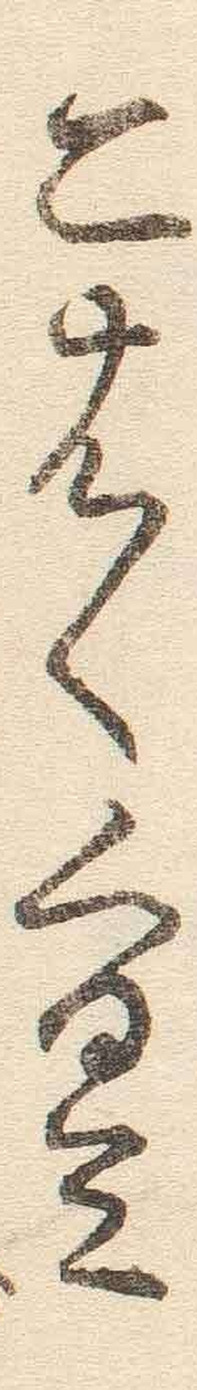こはくくるみ
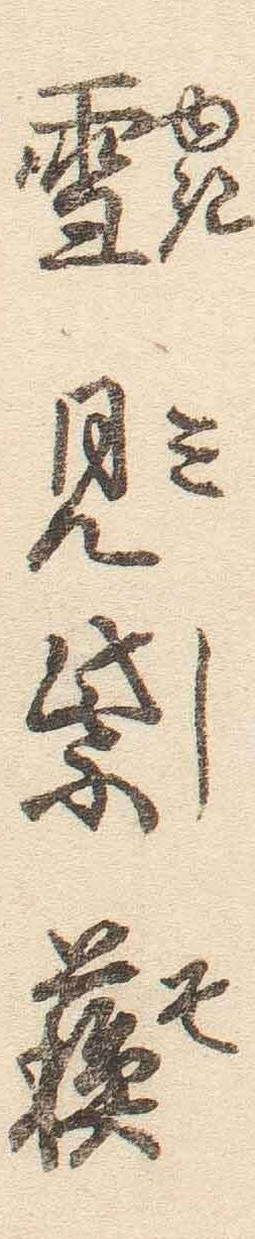雪見紫蘇
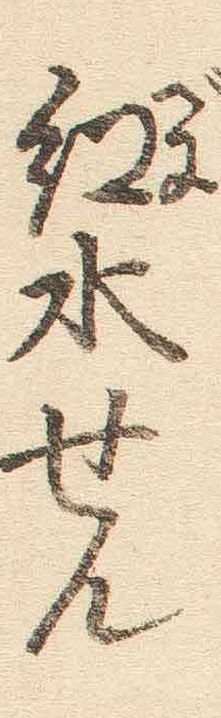紅水せん
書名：料理通
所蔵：東京学芸大学附属図書館 国文学研究資料館
